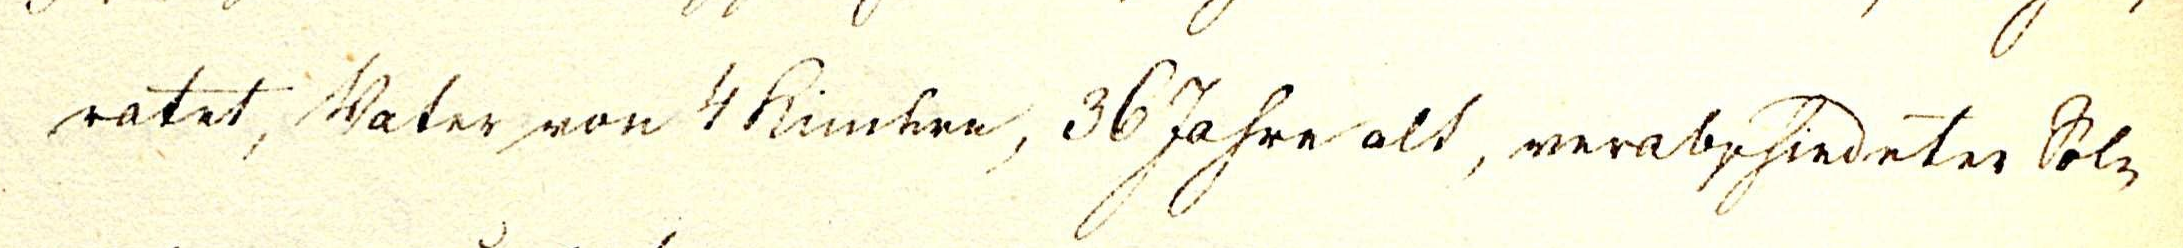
ratet, Vater von 4 Kindern, 36 Jahre alt, verabschiedeter Sol¬
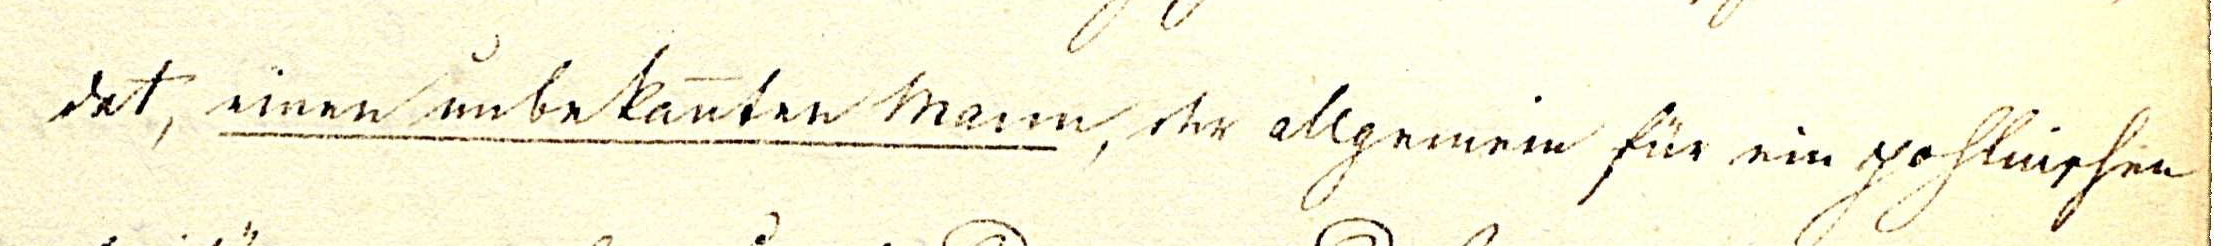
dat, einen unbekannten Mann, der allgemein für ein pohlnischen
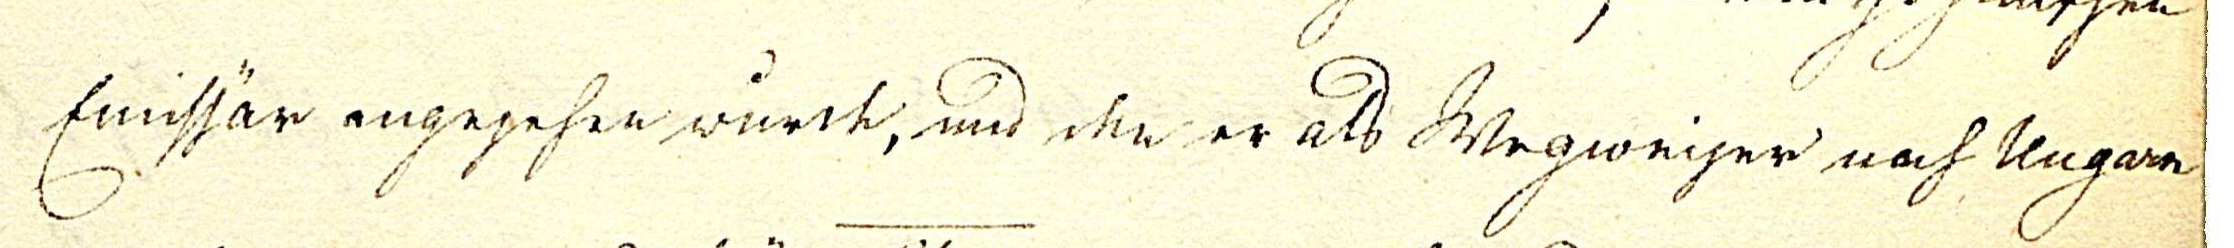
Emissär angesehen wurde, und der er als Wegweiser nach Ungarn
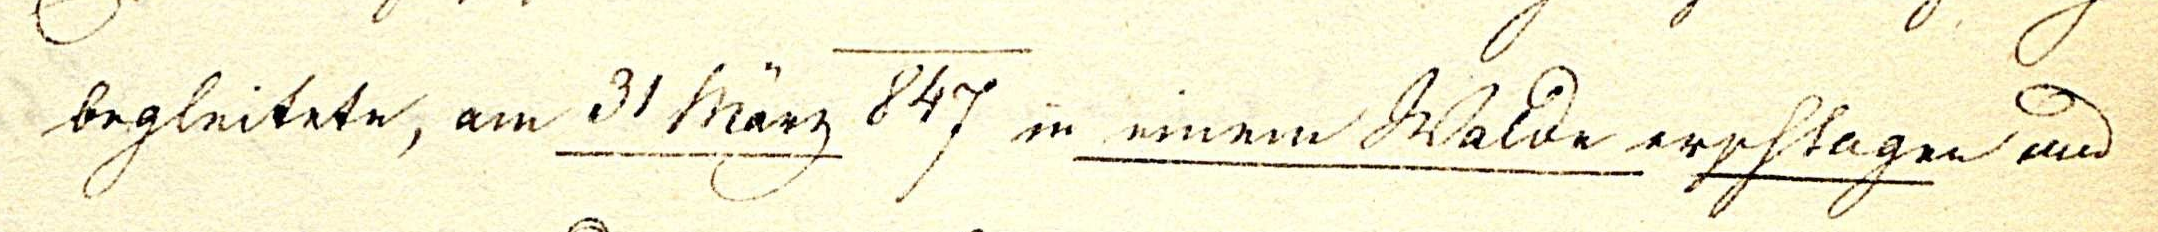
begleitete, am 31 März 847 in eine Walde erschlagen und
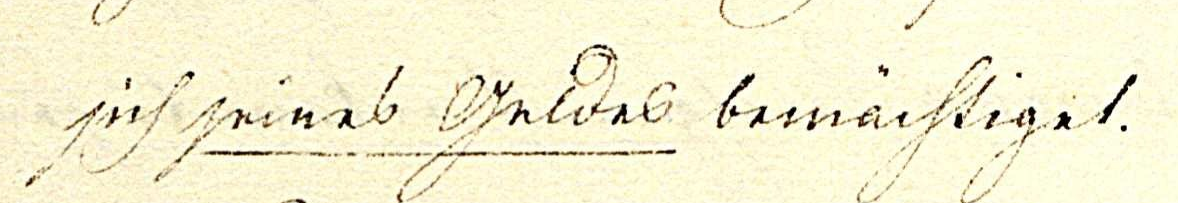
sich seines Geldes bemächtiget.
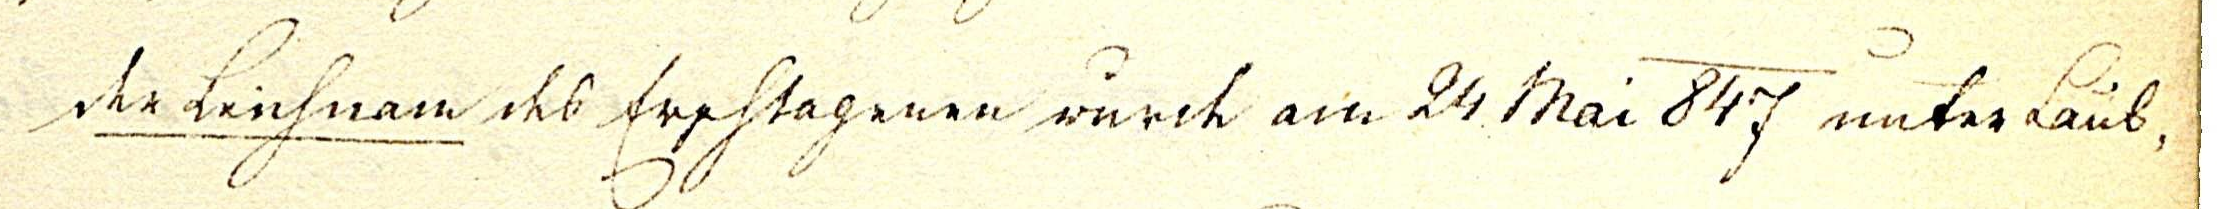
Der Leichnam des Ershlagenen wurde am 24. Mai 847 unter Laub¬
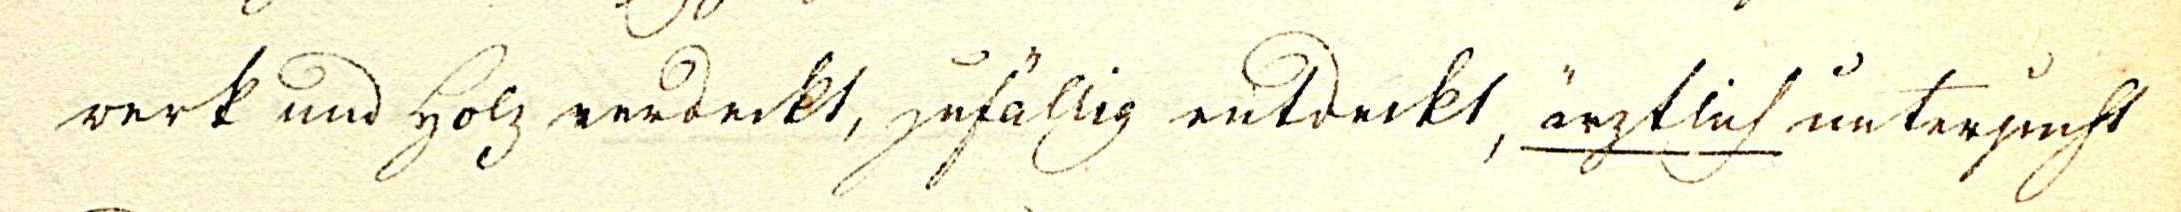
werk und Holz verdeckt, zufällig entdeckt, ärztlich untersucht
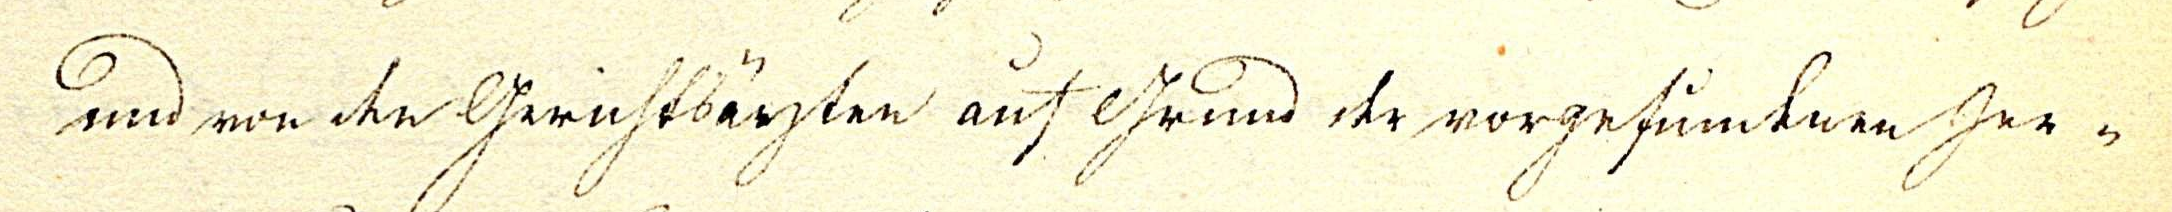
und von der Gerichtsärzten auf Grund der vorgefundene Ze¬
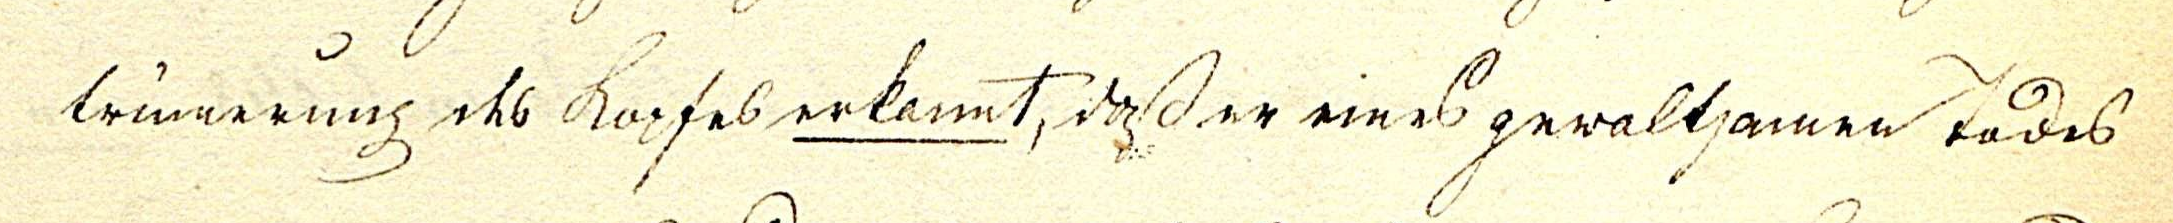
trümerung des Kopfes erkannt, daß er eines gewaltsamen Todes
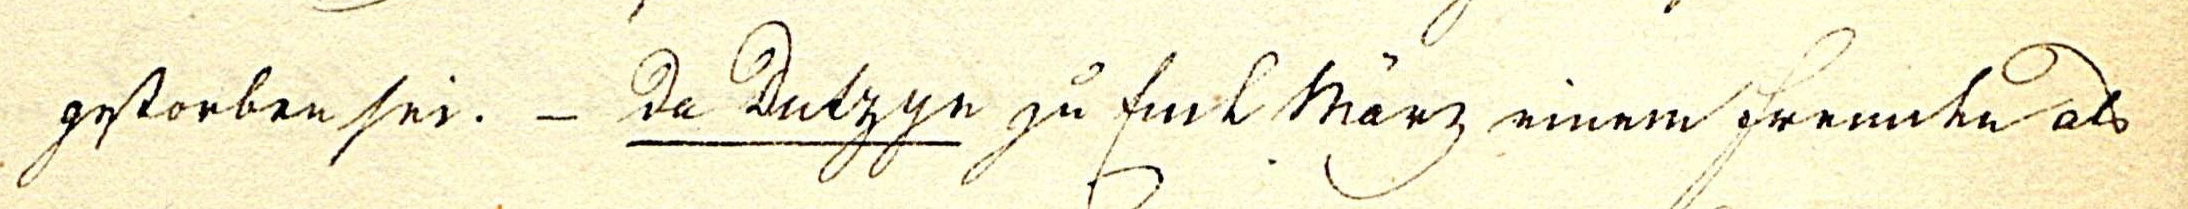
gestorben sei. Da Dutzyn zu Ende März einem fremde als
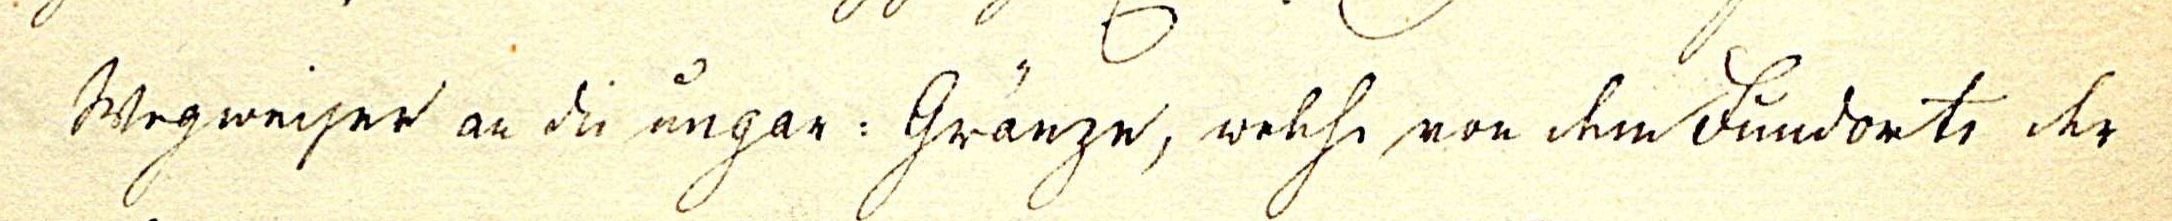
Wegweiser an die ungar. Gränze, welche von dem Fundorte der
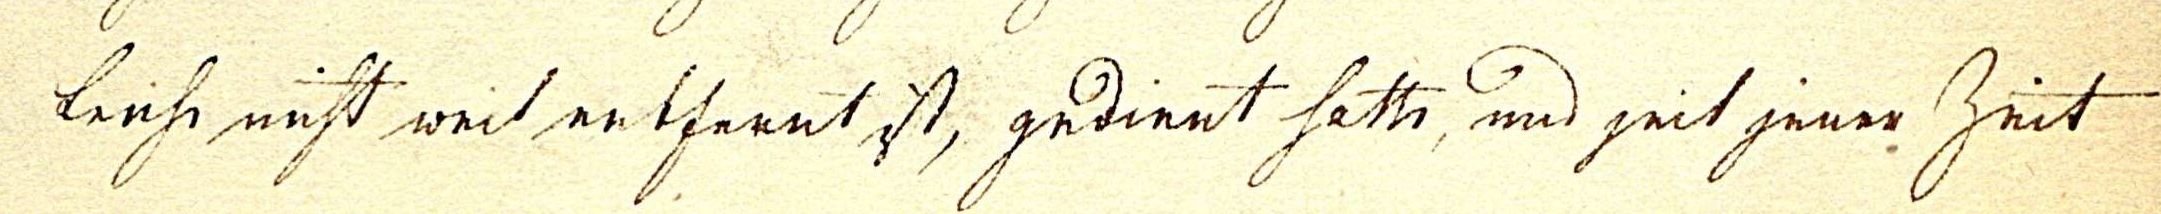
Leiche nicht weit entfernt ist, gedient hatte, und seit jener Zeit
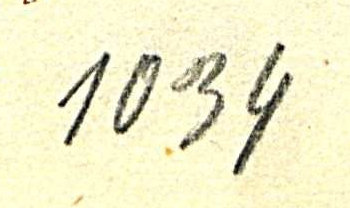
1034
